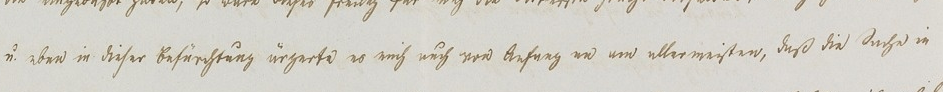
u. eben in dieser Befürchtung ärgerte es mich auch von Anfang an am allermeisten, daß die Sache in
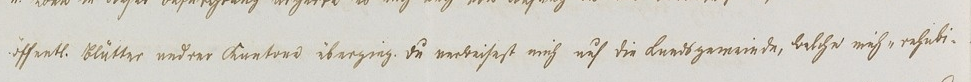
öffentl. Blätter andrer Kantone überging. Du verweisest mich auf die Landsgemeinde, welche mich «rehabi-
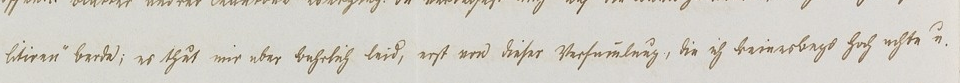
litiren» werde; es thut mir aber wahrlich leid, erst von dieser Versammlung, die ich keinerwegs hoch achte u.
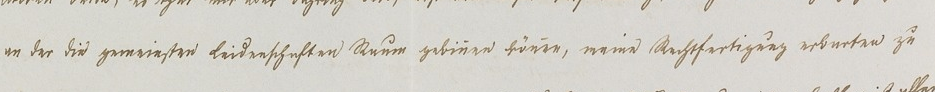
an der die gemeinsten Leidenschaften Raum gewinnen können, meine Rechtfertigung erwarten zu
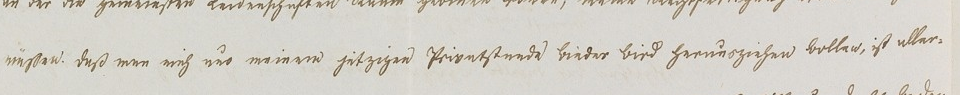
müßen. Daß man mich aus meinem jetzigen Privatstande wieder wird herausziehen wollen, ist aller-
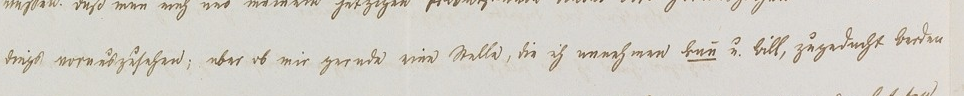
dings vorauszusehen; aber ob mir gerade eine Stelle, die ich annehmen kann u. will, zugedacht werden
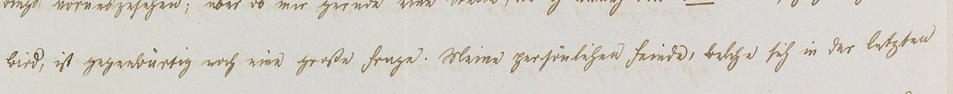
wird, ist gegenwärtig noch eine große Frage. Meine persönlichen Feinde, welche sich in der letzten
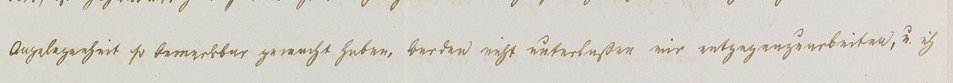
Angelegenheit so bemerkbar gemacht haben, werden nicht unterlaßen mir entgegenzuarbeiten, u. ich
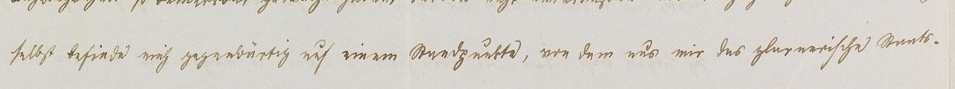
selbst befinde mich gegenwärtig auf einem Standpunkte, von dem aus mir das glarnerische Staats-
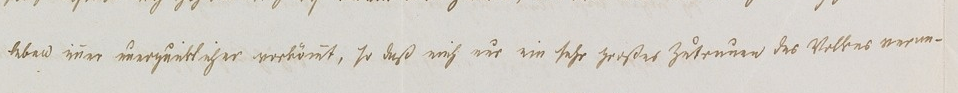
leben immer unerquicklicher vorkömmt, so daß mich nur ein sehr großes Zutrauen des Volkes veran-
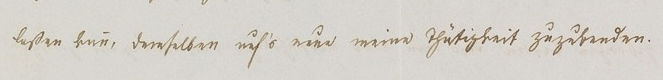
laßen kann, demselben auf's neue meine Thätigkeit zuzuwenden.
